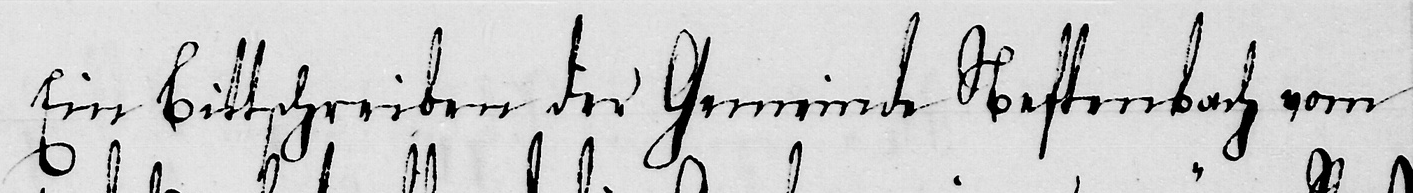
Ein Bittschreiben der Gemeinde Neftenbach vom
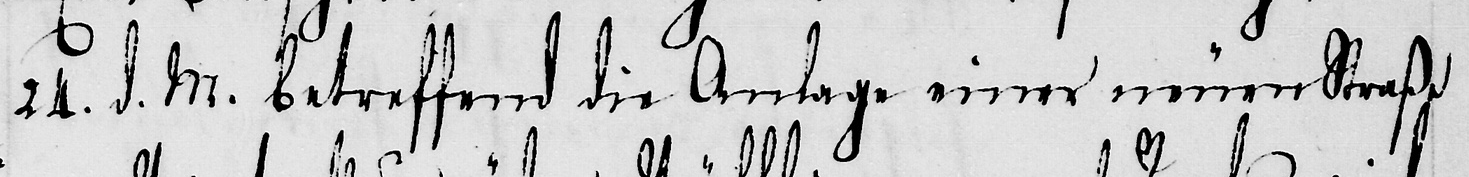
24. d. M. betreffend die Anlage einer neuen Straße
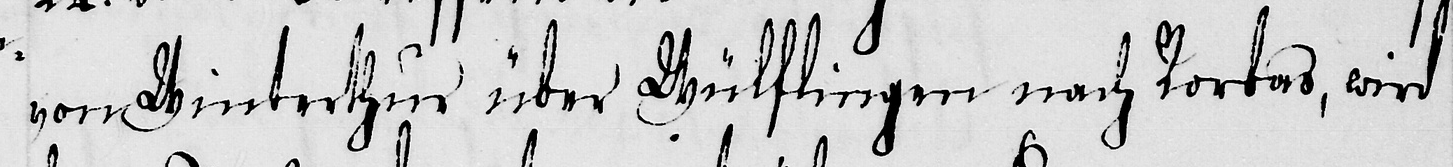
von Winterthur über Wülflingen nach Rorbas, wird
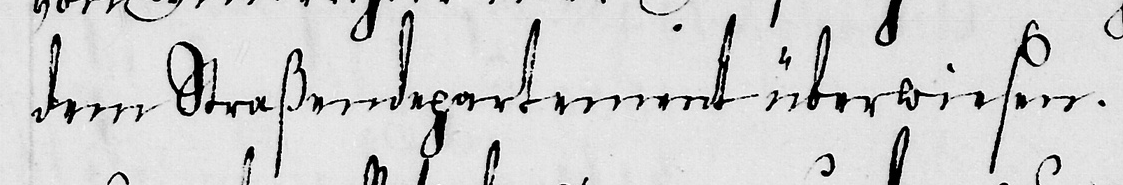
dem Straßendepartement überwiesen.
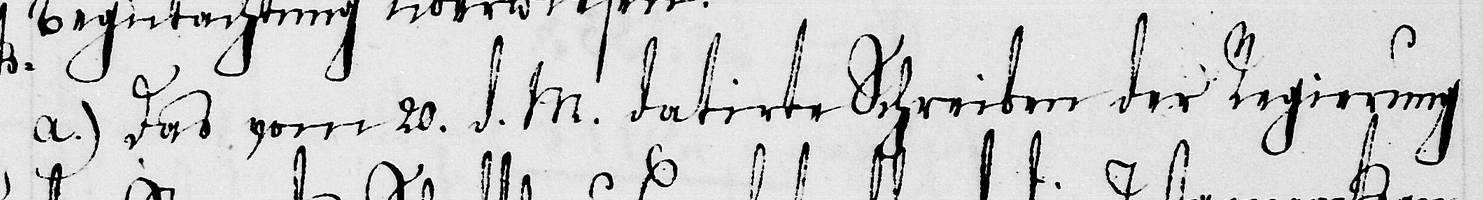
a.) Das vom 20. d. M. datirte Schreiben der Regierung
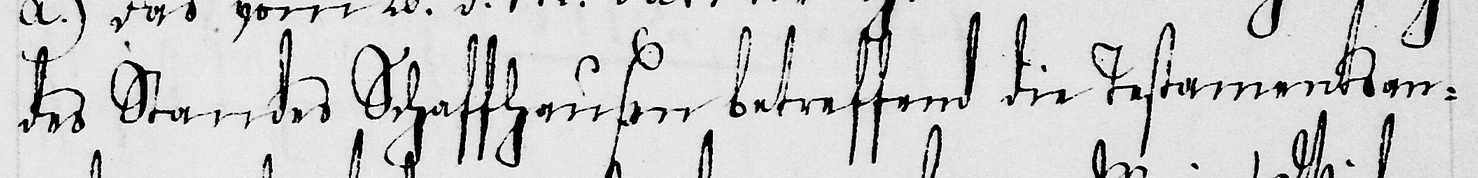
des Standes Schaffhausen betreffend die Testamentsan¬
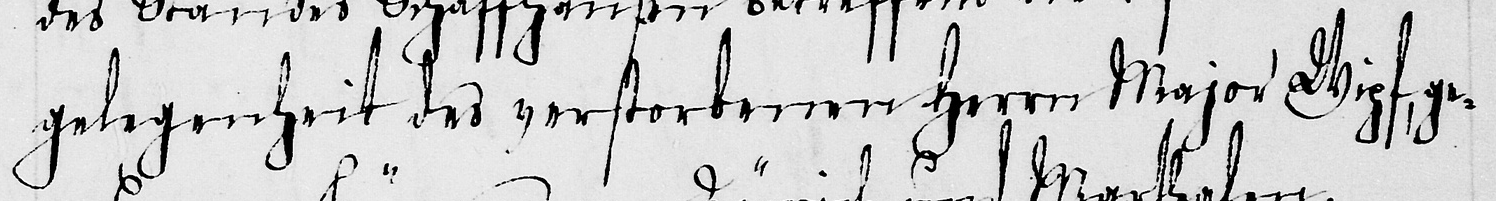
gelegenheit des verstorbenen Herrn Major Wipf, ge¬
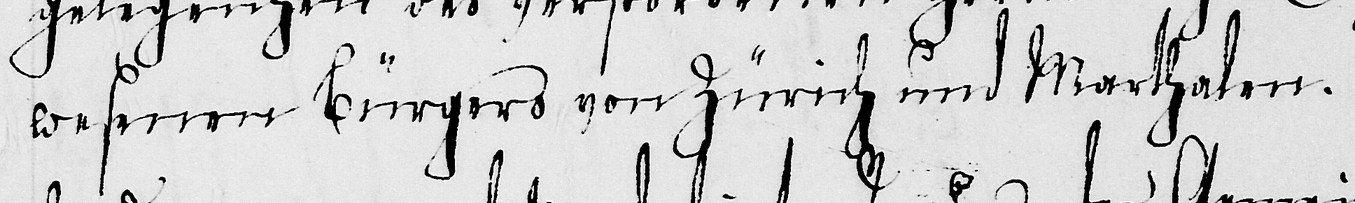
wesenen Bürgers von Zürich und Marthalen.
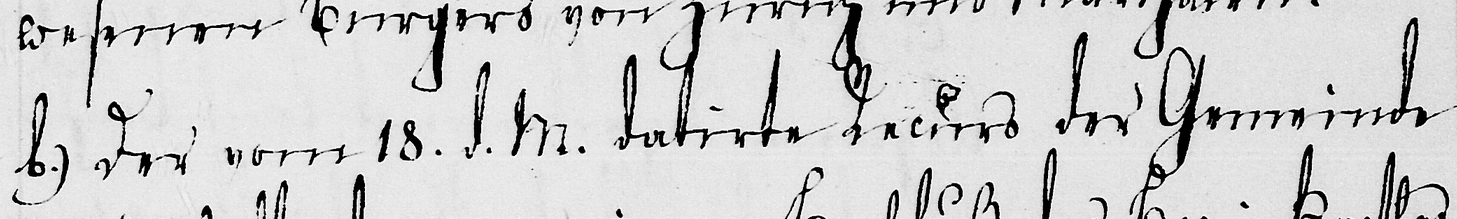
b.) Der vom 18. d. M. datirte Recurs der Gemeinde
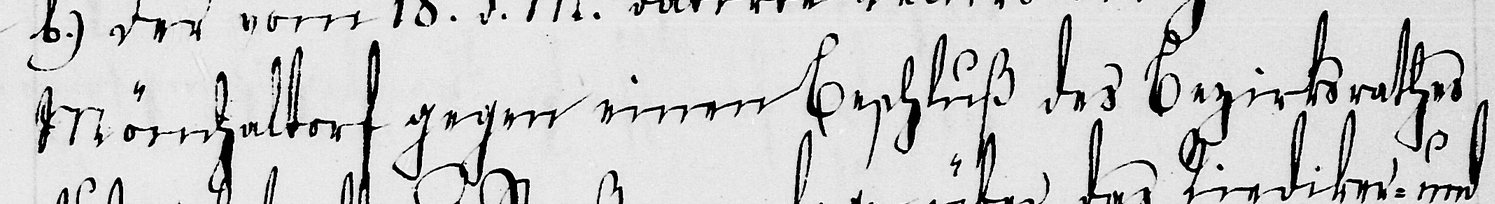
Mönchaltorf gegen einen Beschluß des Bezirksrathes
